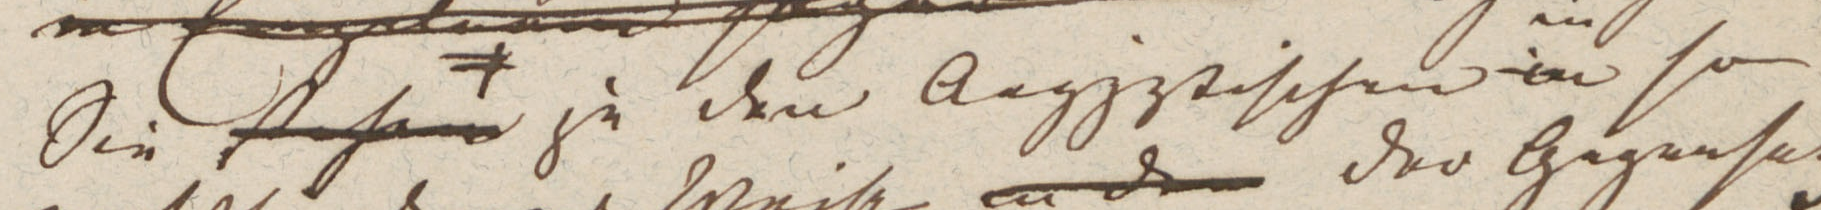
Sie stehen % zu den Aegyptischen in in so
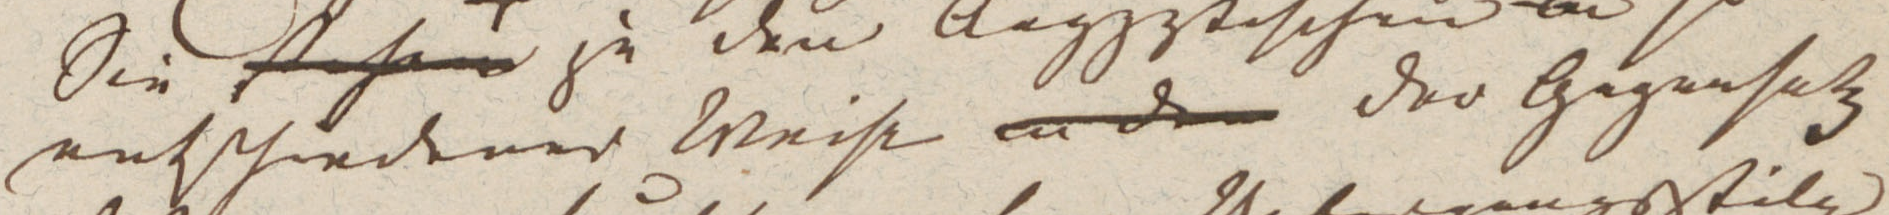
entschiedener Weise in den der Gegensatz
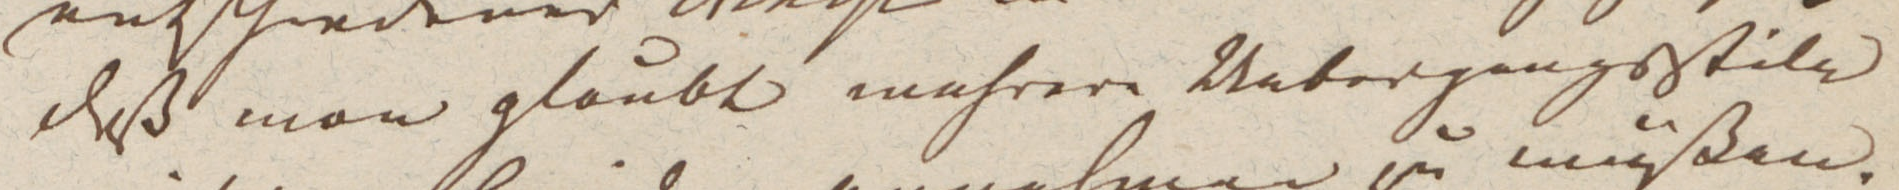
dass man glaubt mehrere Uebergangsstile
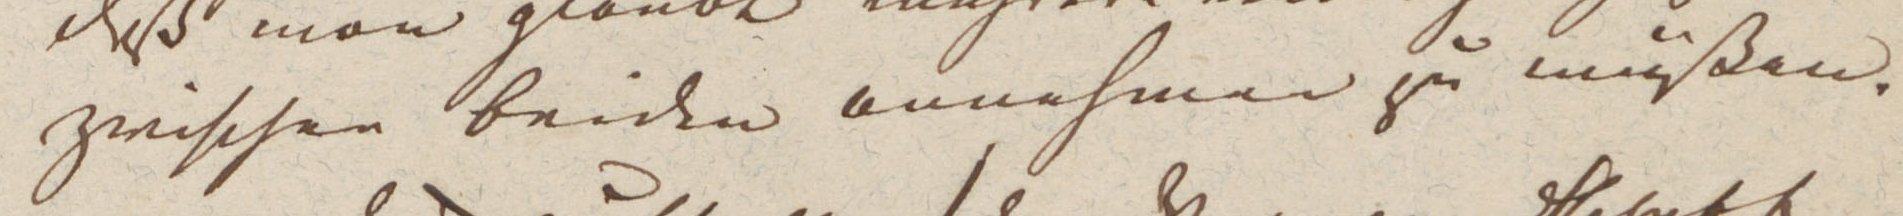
zwischen beiden annehmen zu müssen.
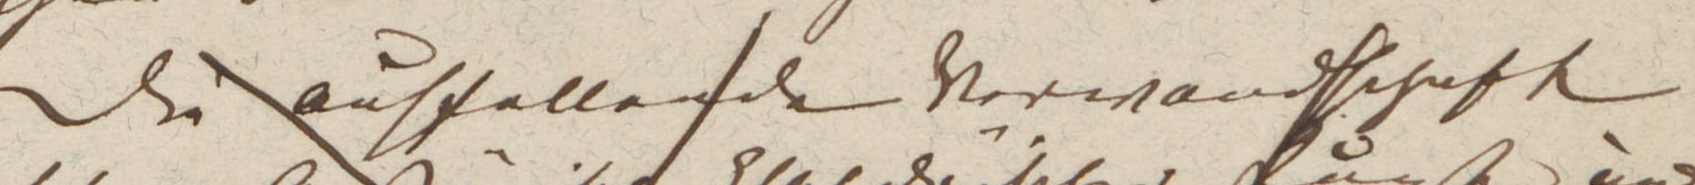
Die auffallende Verwandschaft
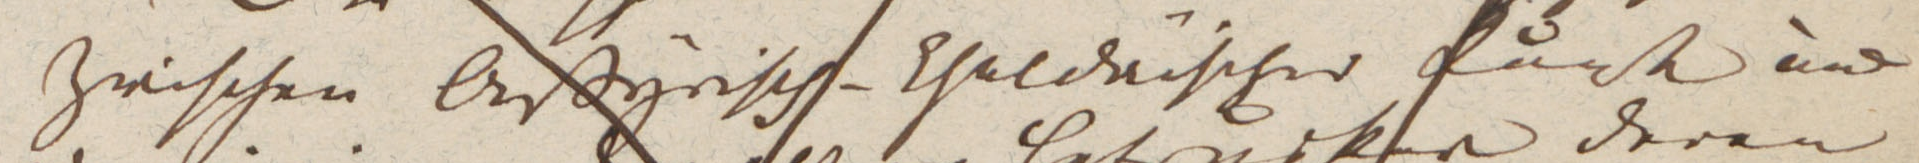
zwischen Assyrisch-Chaldäischer Kunst und
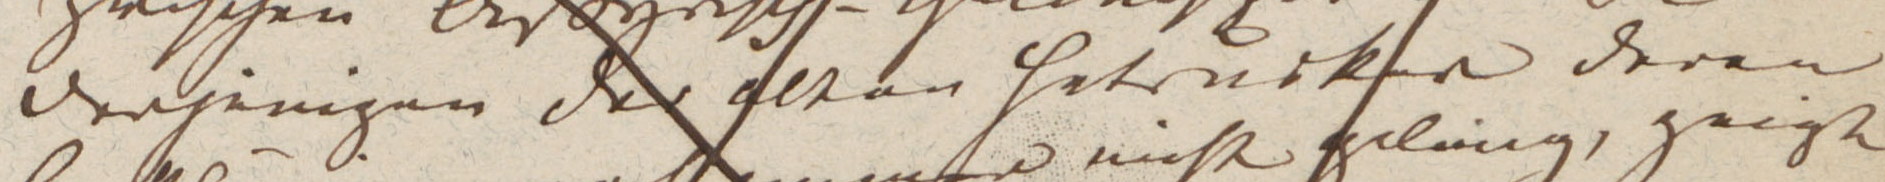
derjenigen der alten Hetrusker deren
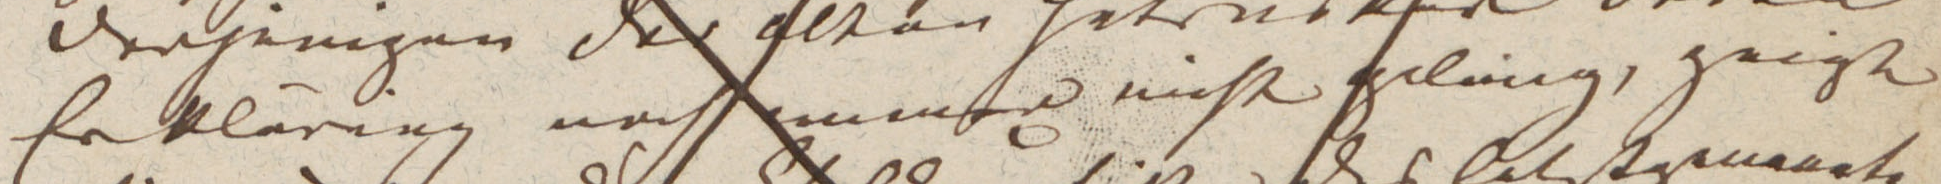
Erklärung noch immer nicht gelang, zeigt
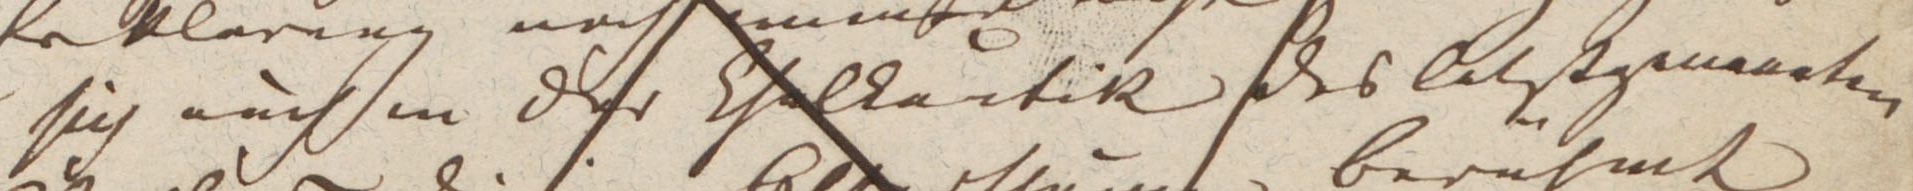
sich auch in der Chalkeutik des letztgenannten
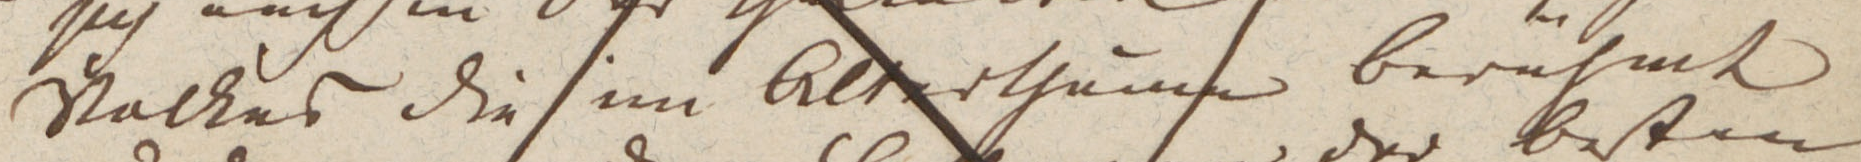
Volkes die im Alterthume berühmt
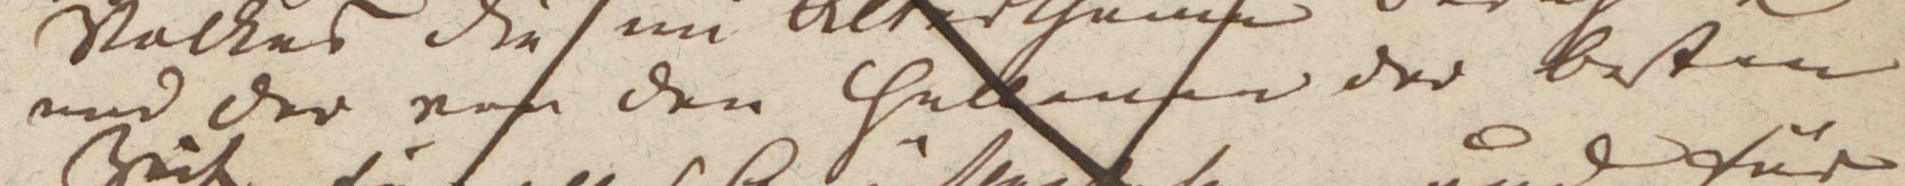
und der von den Hellenen der besten
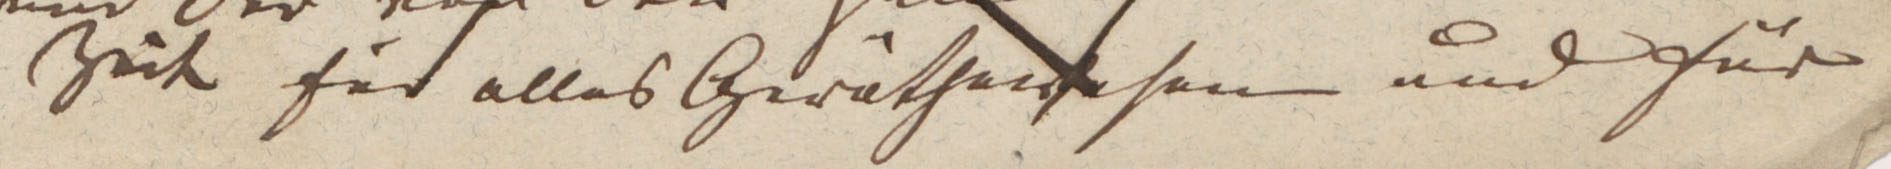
Zeit für alles Geräthewesen und für
